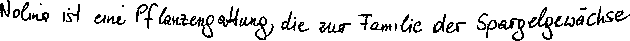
Nolina ist eine Pflanzengattung, die zur Familie der Spargelgewächse
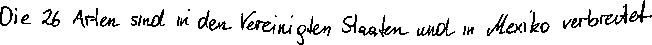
Die 26 Arten sind in den Vereinigten Staaten und in Mexiko verbreitet.
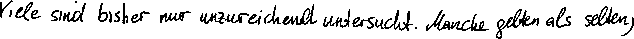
Viele sind bisher nur unzureichend untersucht. Manche gelten als selten,
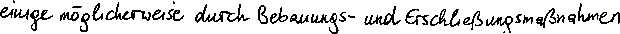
einige möglicherweise durch Bebauungs- und Erschließungsmaßnahmen
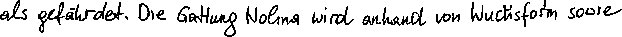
als gefährdet. Die Gattung Nolina wird anhand von Wuchsform sowie
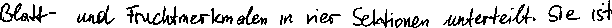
Blatt- und Fruchtmerkmalen in vier Sektionen unterteilt. Sie ist
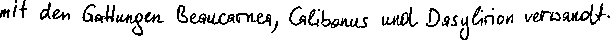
mit den Gattungen Beaucarnea, Calibanus und Dasylirion verwandt.
